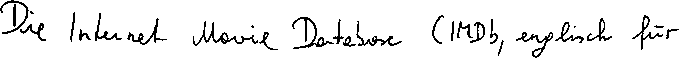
Die Internet Movie Database (IMDb, englisch für
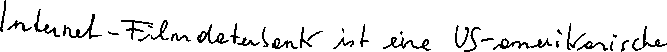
Internet-Filmdatenbank) ist eine US-amerikanische
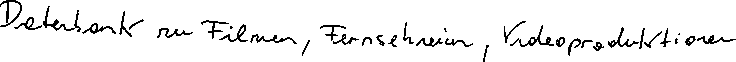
Datenbank zu Filmen, Fernsehserien, Videoproduktionen
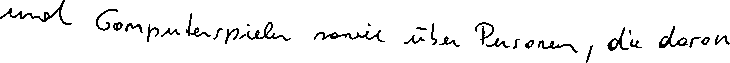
und Computerspielen sowie über Personen, die daran
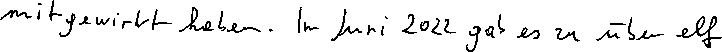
mitgewirkt haben. Im Juni 2022 gab es zu über elf
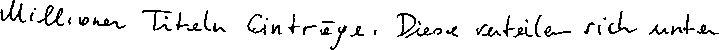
Millionen Titeln Einträge. Diese verteilen sich unter
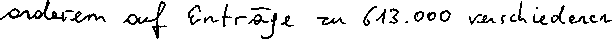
anderem auf Einträge zu 613.000 verschiedenen
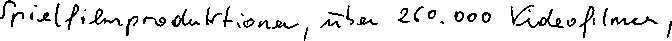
Spielfilmproduktionen, über 260.000 Videofilmen,
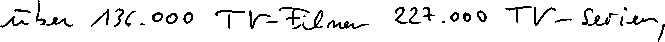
über 136.000 TV-Filmen, 227.000 TV-Serien,
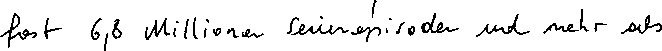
fast 6,8 Millionen Serienepisoden und mehr als
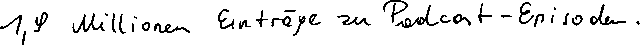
1,9 Millionen Einträge zu Podcast-Episoden.
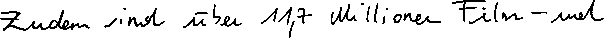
Zudem sind über 11,7 Millionen Film- und
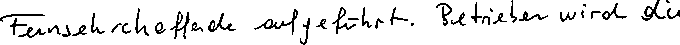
Fernsehschaffende aufgeführt. Betrieben wird die
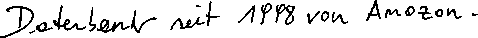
Datenbank seit 1998 von Amazon.
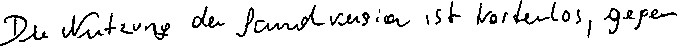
Die Nutzung der Grundversion ist kostenlos, gegen
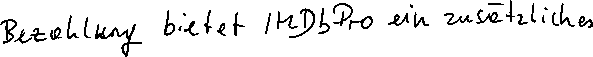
Bezahlung bietet IMDbPro ein zusätzliches
